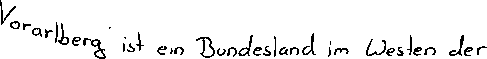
Vorarlberg ist ein Bundesland im Westen der
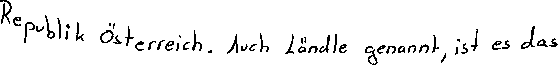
Republik Österreich. Auch Ländle genannt, ist es das
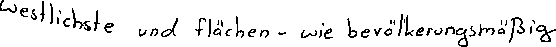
westlichste und flächen- wie bevölkerungsmäßig
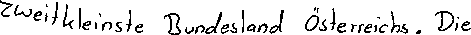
zweitkleinste Bundesland Österreichs. Die
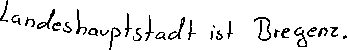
Landeshauptstadt ist Bregenz.
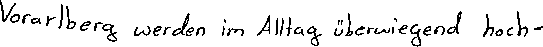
Vorarlberg werden im Alltag überwiegend hoch-
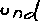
und
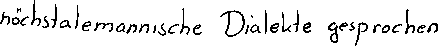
höchstalemannische Dialekte gesprochen
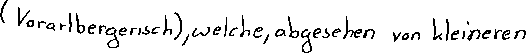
(Vorarlbergerisch), welche, abgesehen von kleineren
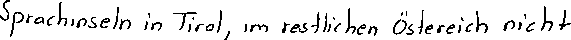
Sprachinseln in Tirol, im restlichen Österreich nicht
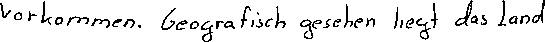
vorkommen. Geografisch gesehen liegt das Land
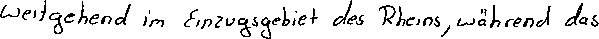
weitgehend im Einzugsgebiet des Rheins, während das
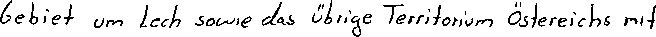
Gebiet um Lech sowie das übrige Territorium Österreichs mit
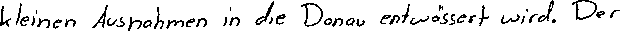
kleinen Ausnahmen in die Donau entwässert wird.Der
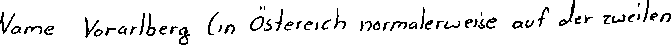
Name Vorarlberg (in Österreich normalerweise auf der zweiten
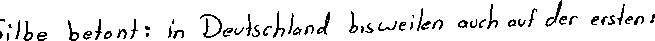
Silbe betont: in Deutschland bisweilen auch auf der ersten:
